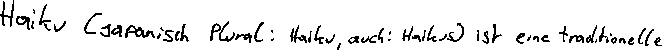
Haiku (japanisch Plural: Haiku, auch: Haikus) ist eine traditionelle
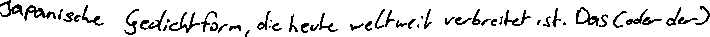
japanische Gedichtform, die heute weltweit verbreitet ist. Das (oder der)
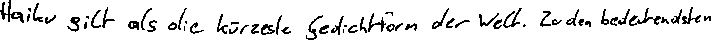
Haiku gilt als die kürzeste Gedichtform der Welt. Zu den bedeutendsten
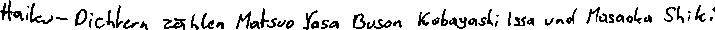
Haiku-Dichtern zählen Matsuo Yosa Buson Kobayashi Issa und Masaoka Shiki
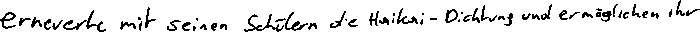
erneuerte mit seinen Schülern die Haikai-Dichtung und ermöglichte ihr
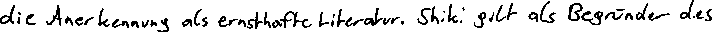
die Anerkennung als ernsthafte Literatur. Shiki gilt als Begründer des
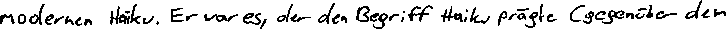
modernen Haiku. Er war es, der den Begriff Haiku prägte (gegenüber dem
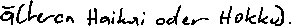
älteren Haikai oder Hokku).
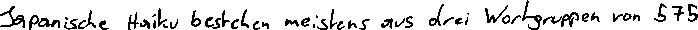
Japanische Haiku bestehen meistens aus drei Wortgruppen von 5 7 5
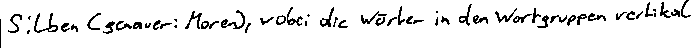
Silben (genauer: Moren), wobei die Wörter in den Wortgruppen vertikal
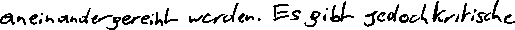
aneinandergereiht werden. Es gibt jedoch kritische
